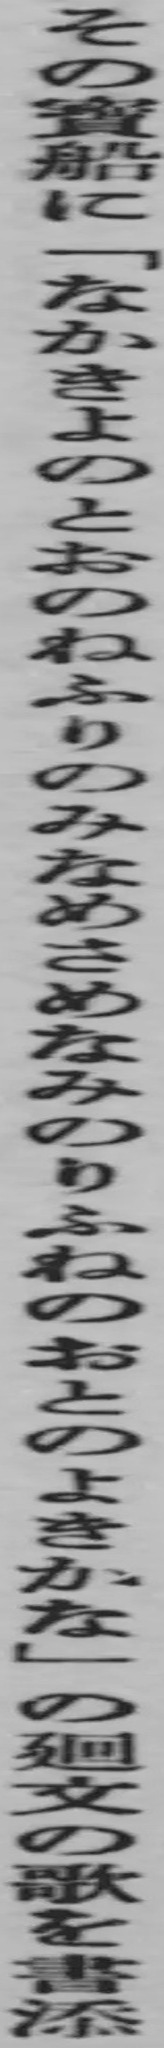その寶船に「なかきよのとおのねふりのみなめさめなみのりふねのおとのよきかな」の廻文の歌を書添
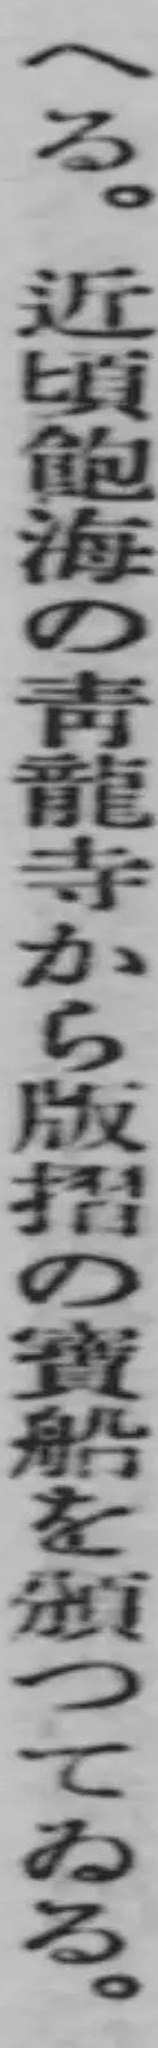へる。近頃飽海の靑龍寺から版摺の寶船を頒つてゐる。
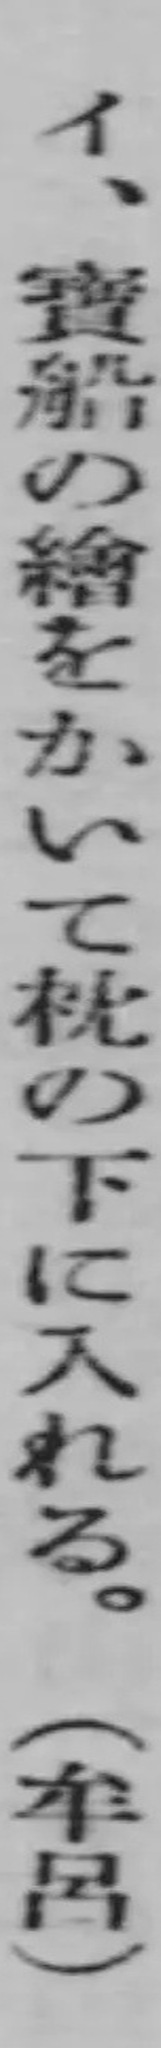イ、寶船の繪をかいて枕の下に入れる。(牟呂)

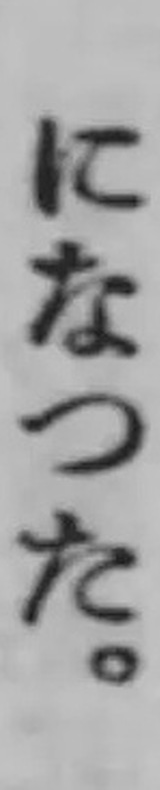になつた。
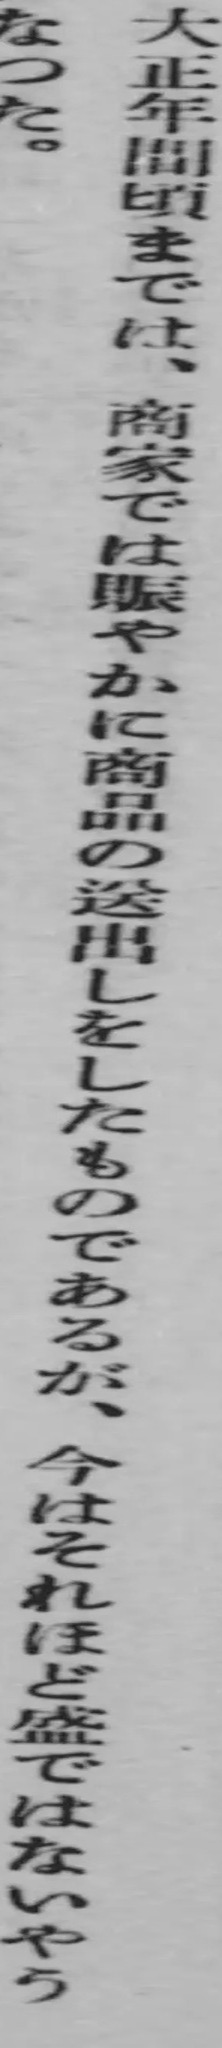大正年間頃までは、商家では賑やかに商品の送出しをしたものであるが、今はそれほど盛ではないやう
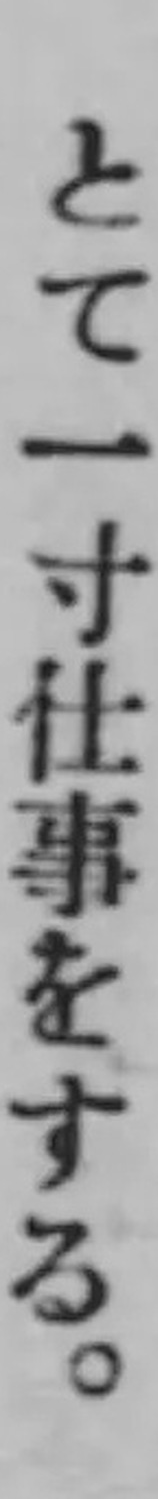とて一寸仕事をする。
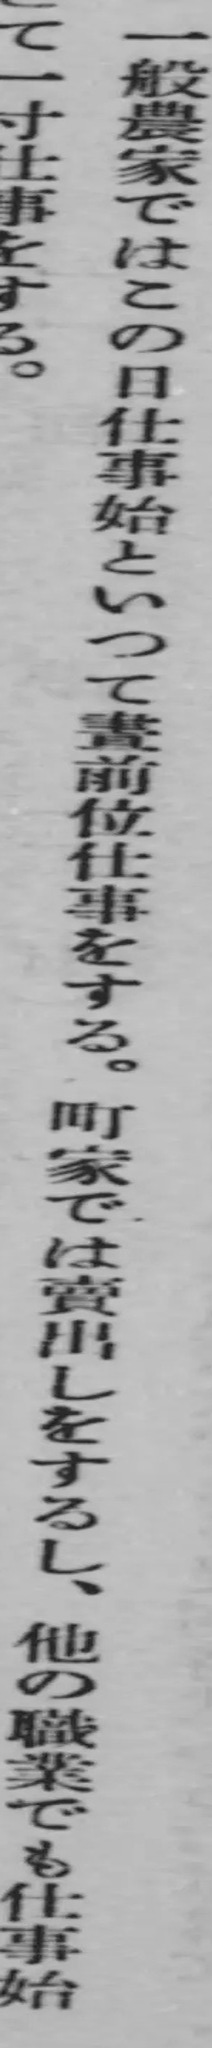一般農家ではこの日仕事始といつて晝前位仕事をする。町屋では賣出しをするし、他の職業でも仕事始
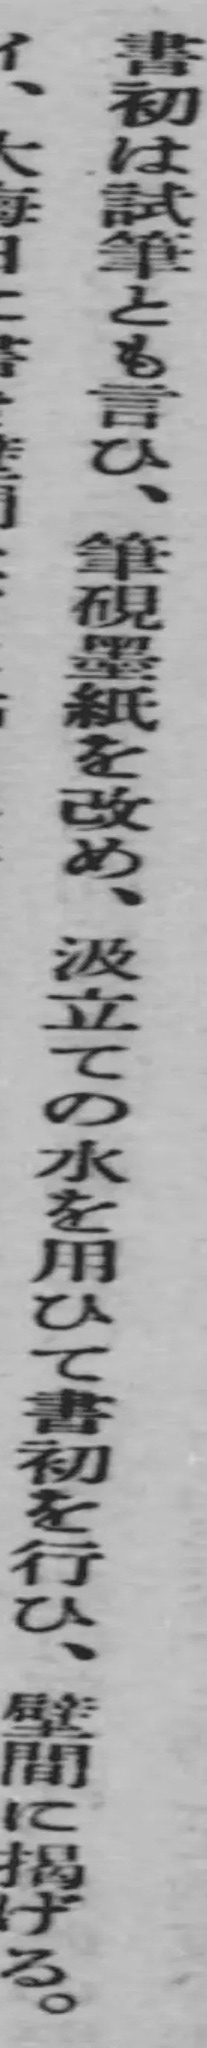書初は試筆とも言ひ、筆硯墨紙を改め、汲立ての水を用ひて書初を行ひ、壁間に揭げる。
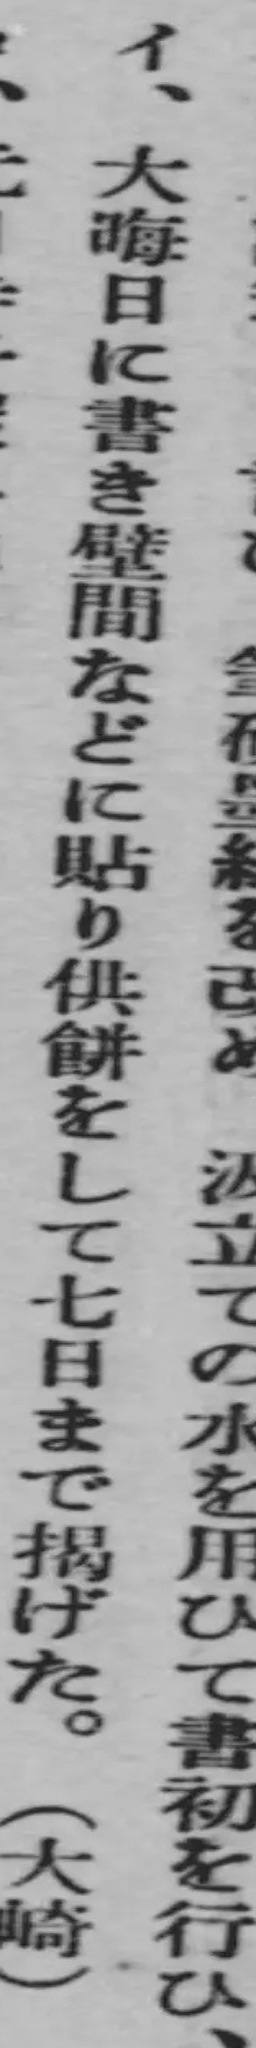イ、大晦日に書き壁間などに貼り供餅をして七日まで揭げた。(大崎)
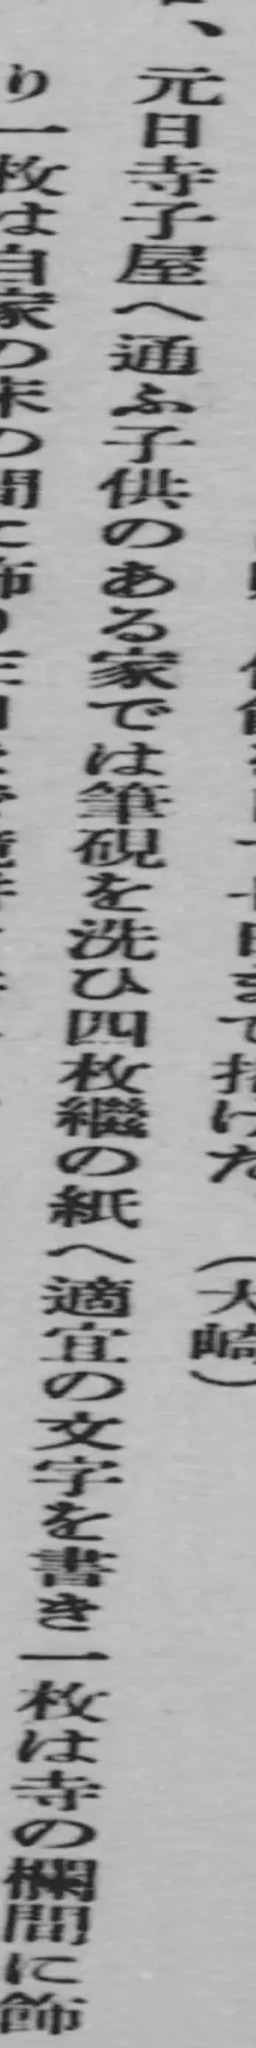ロ、元日寺子屋へ通ふ子供のある家では筆硯を洗ひ四枚繼の紙へ適宜の文字を書き一枚は寺の欄間に飾
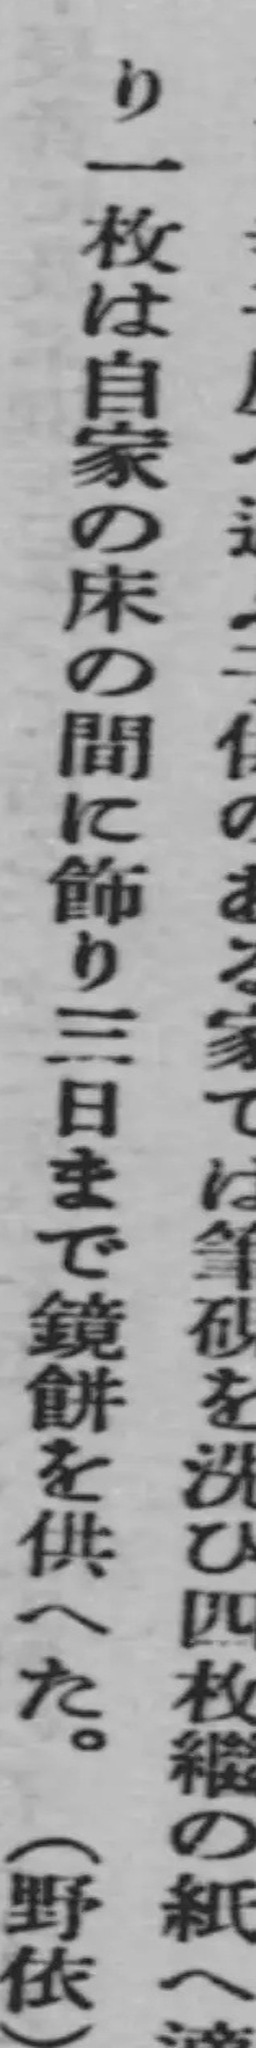り一枚は自家の床の間に飾り三日まで鏡餅を供へた。(野依)
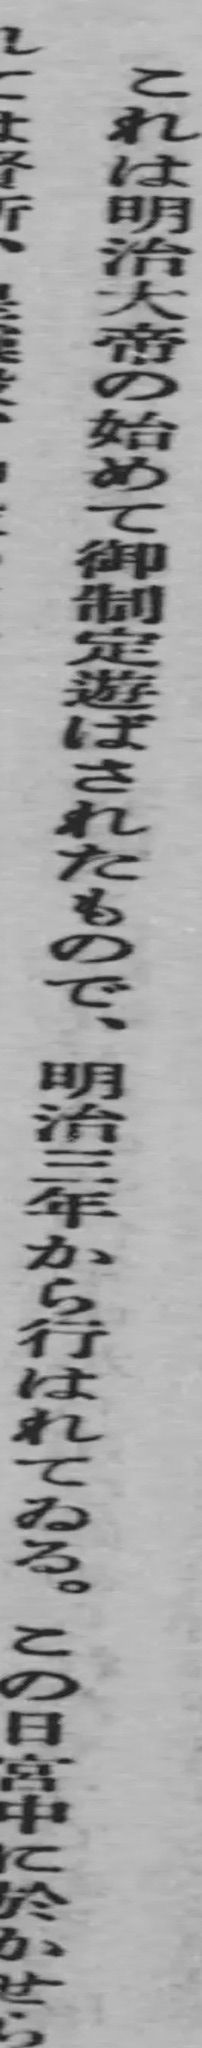これは明治大帝の始めて御制定遊ばされたもので、明治三年から行はれてゐる。この日宮中に於かせら
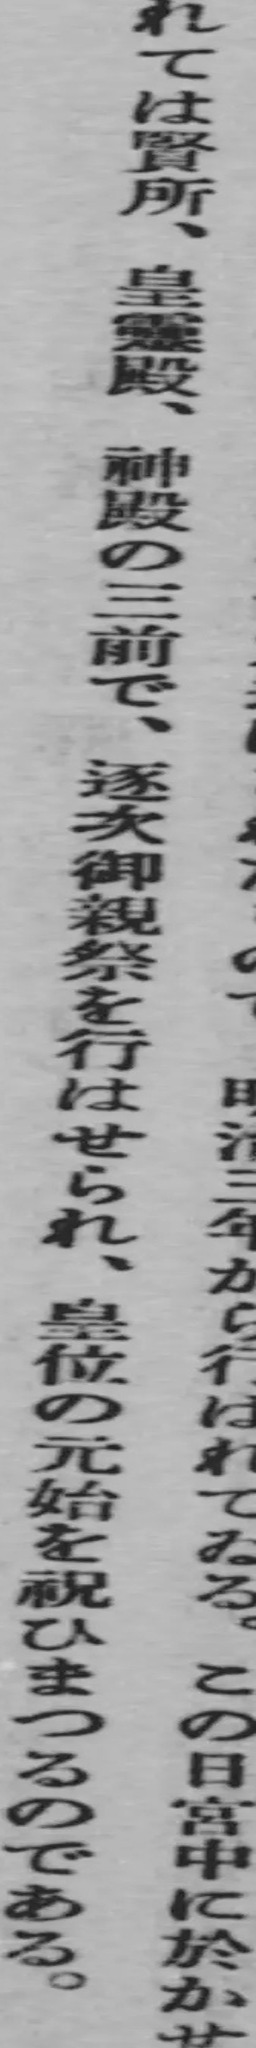れては賢所、皇靈殿、神殿の三前で、逐次御親祭を行はせられ、皇位の元始を祝ひまつるのである。
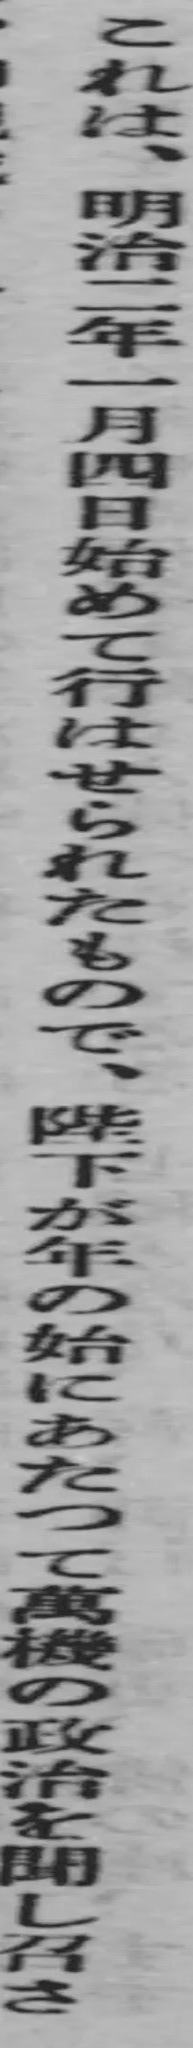これは、明治二年一月四日始めて行はせられたもので、陛下が年の始にあたつて萬機の政治を聞し召さ
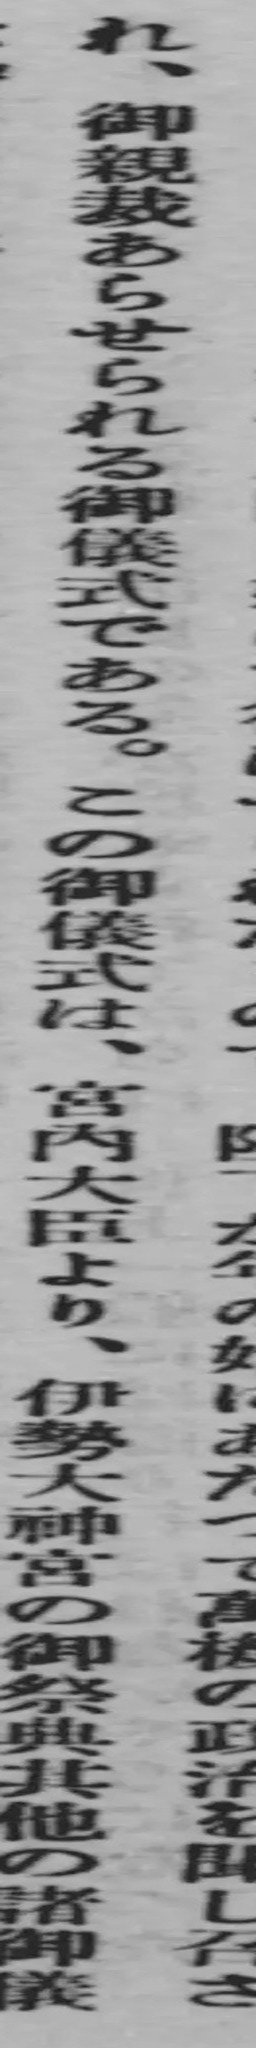れ、御親裁あらせられる御儀式である。この御儀式は、宮内大臣より、伊勢大神宮の御祭典其他の諸御儀
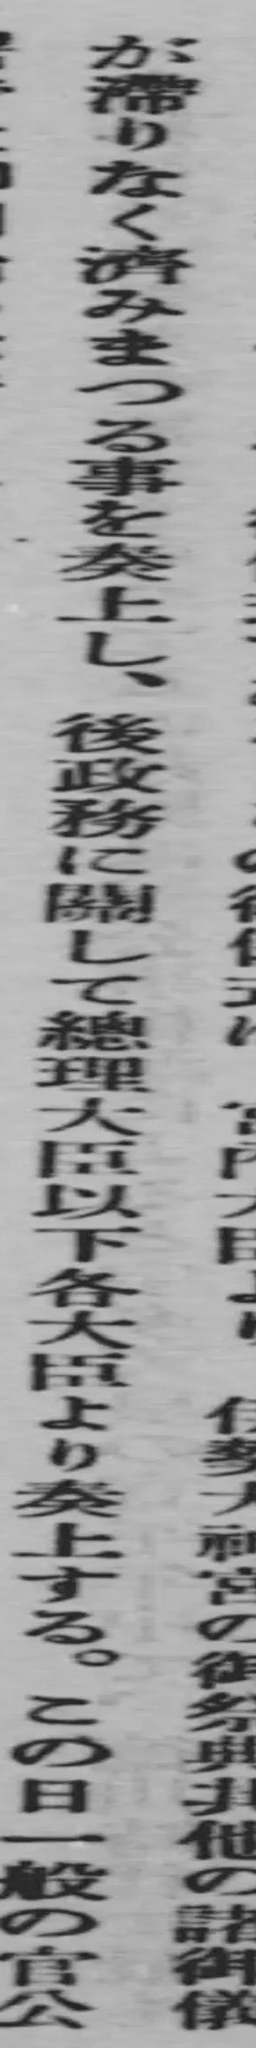が滯りなく濟みまつる事を奏上し、後政務に關して總理大臣以下各大臣より奏上する。この日一般の官公
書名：豊橋の年中行事
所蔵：国立国会図書館 National Diet Library, JAPAN
